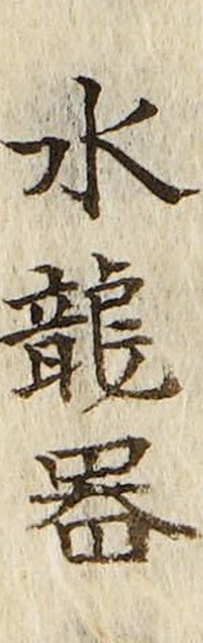水竜器
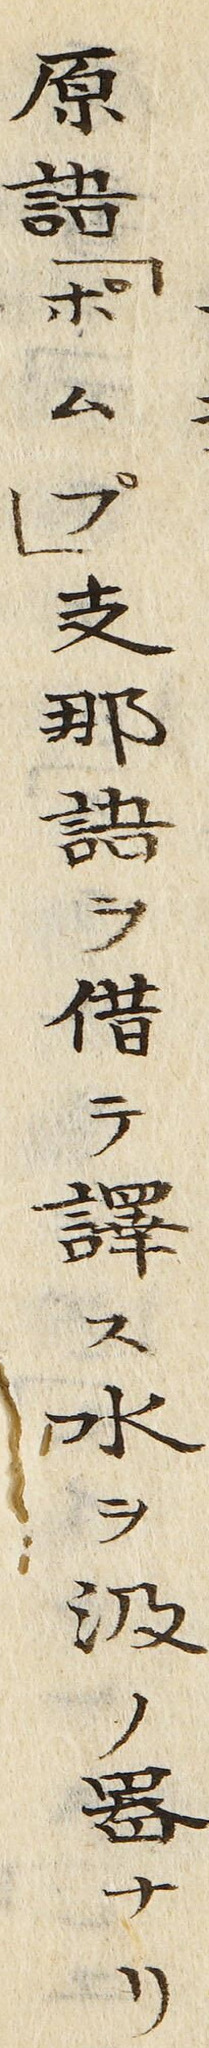原語「ポムプ」支那語ヲ借テ訳ス水ヲ汲ノ器ナリ
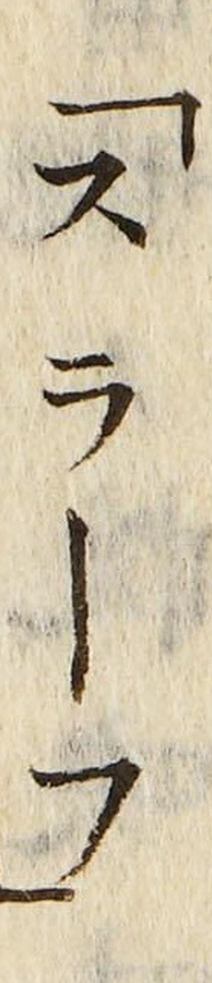「スラーフ」
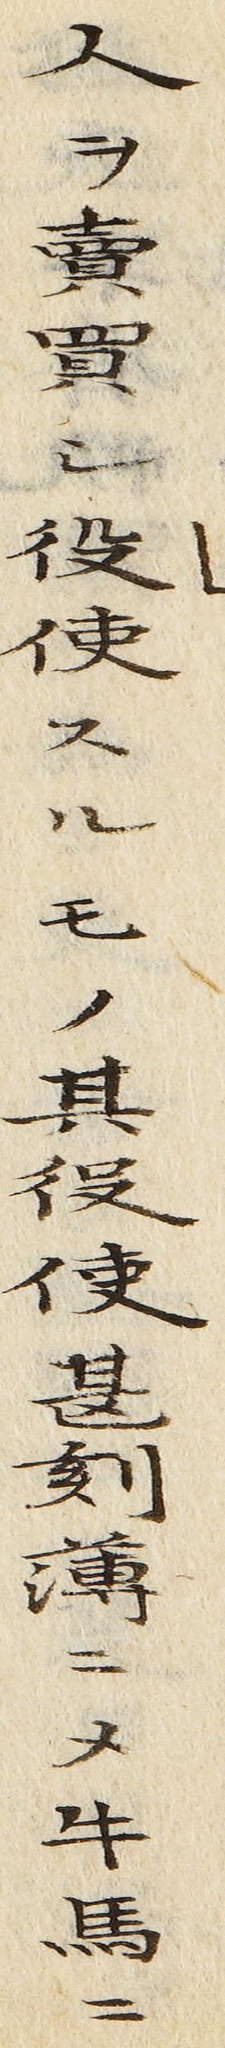人ヲ売買シ役使スルモノ其役使甚刻薄ニシテ牛馬ニ
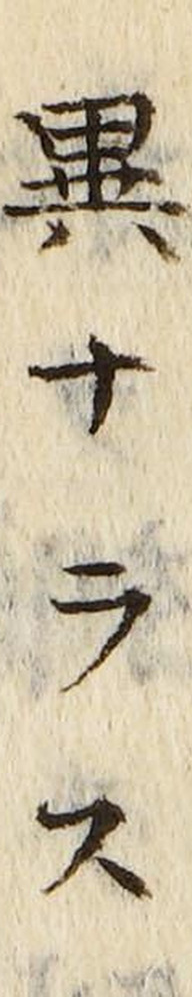異ナラス
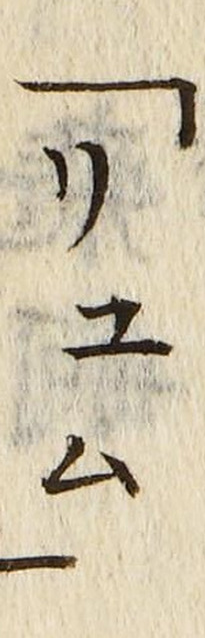「リュム」
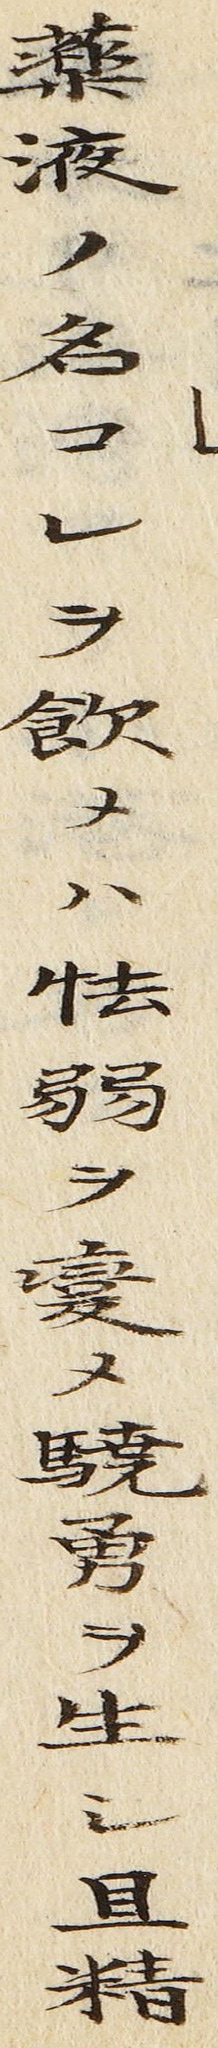薬液ノ名コレヲ飲メハ怯弱ヲ変シテ驍勇ヲ生シ且精
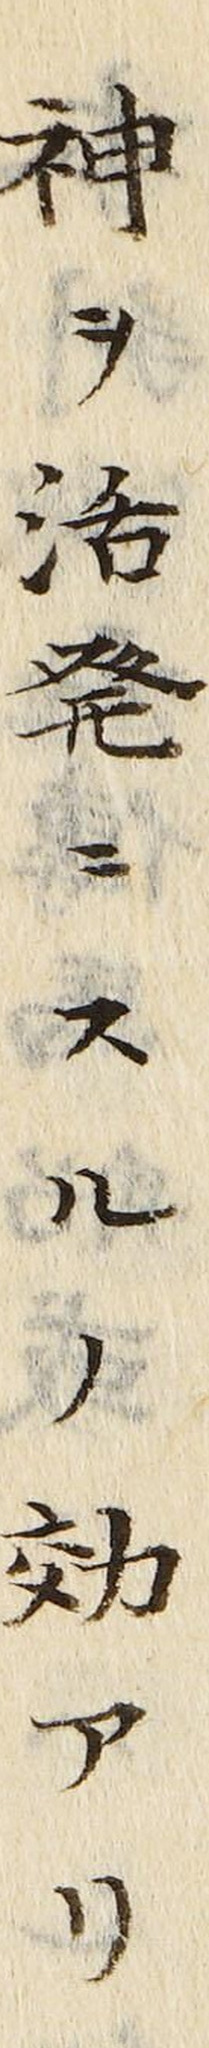神ヲ活発ニスルノ効アリ
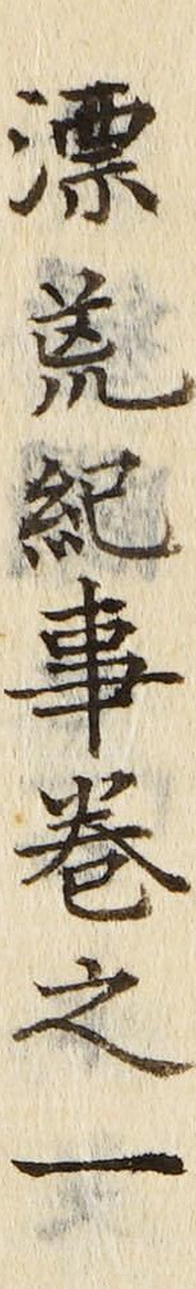漂荒紀事巻之一
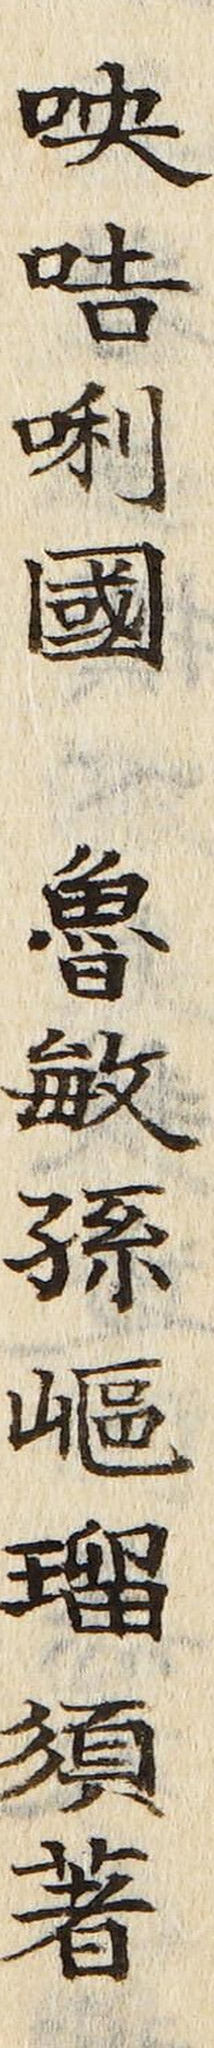咉咭唎国魯敏孫嶇瑠須著
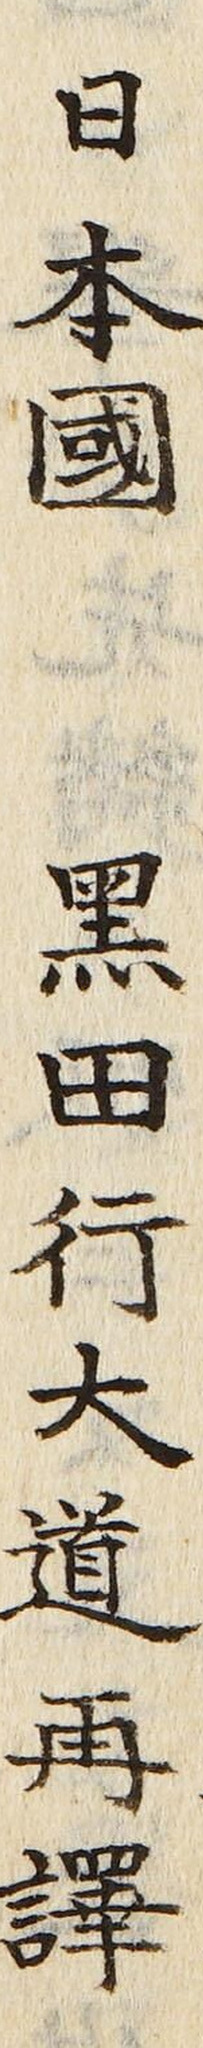日本国黒田行大道再訳
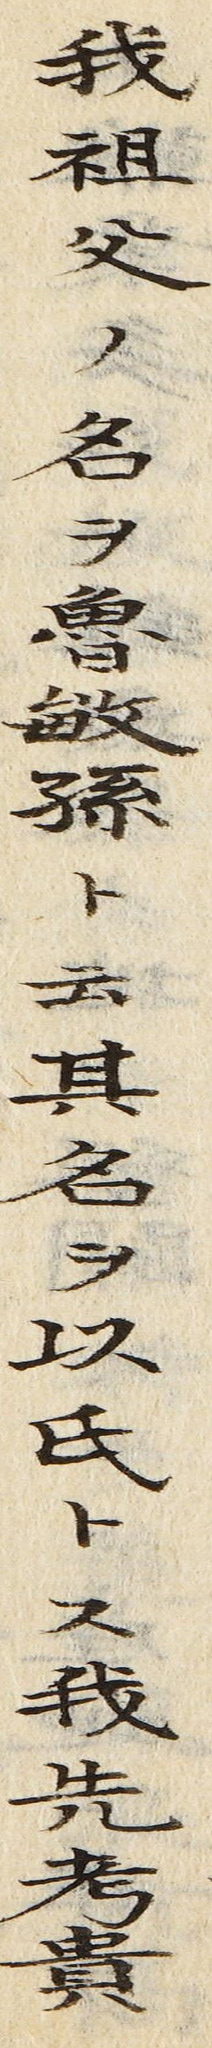我祖父ノ名ヲ魯敏孫ト云其名ヲ以氏トス我先考貴
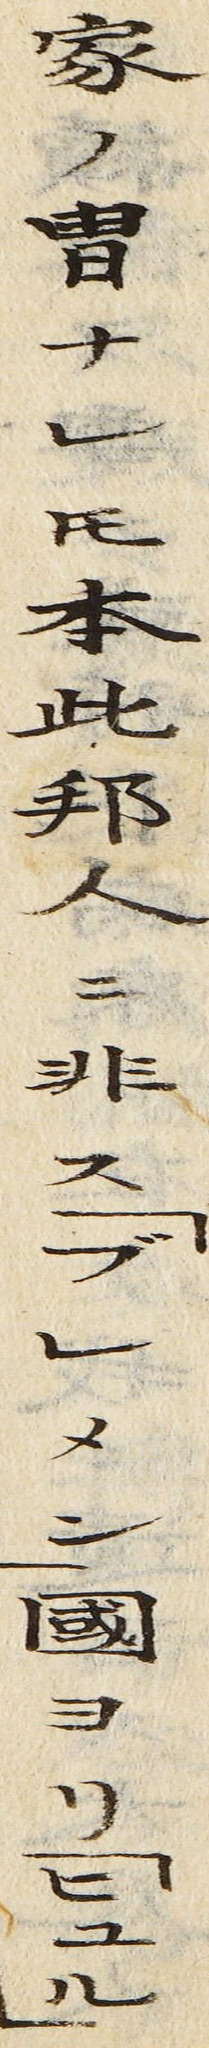家ノ胄ナレトモ本此邦人ニ非ス「ブレメン」国ヨリ「ヒュル」
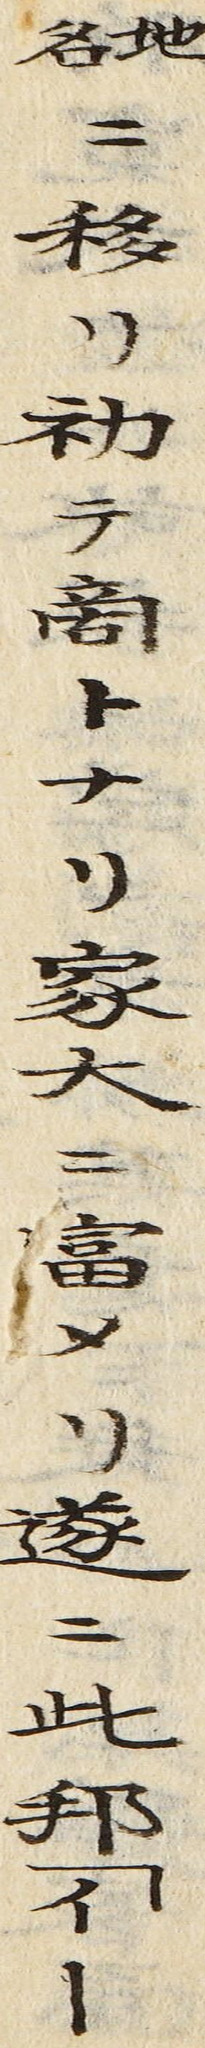地名ニ移リ初テ商トナリ家大ニ富メリ遂ニ此邦「イー
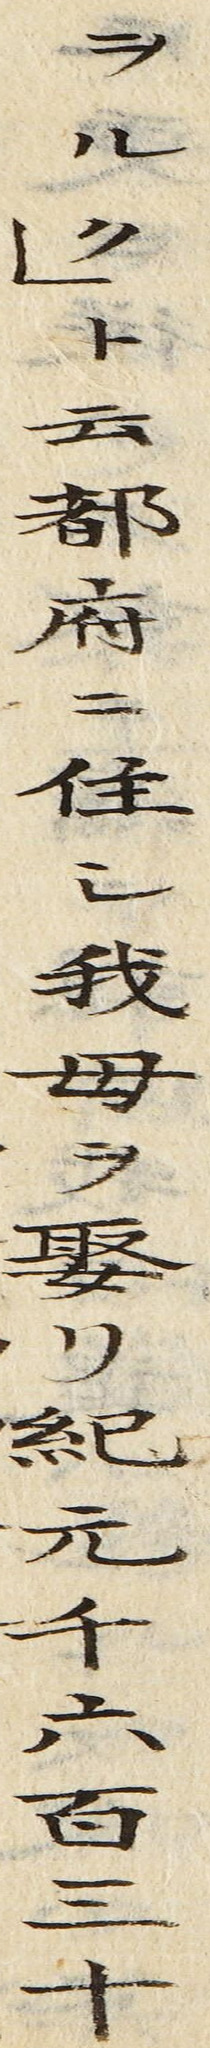ヲルク」ト云都府ニ住シ我母ヲ娶リ紀元千六百三十
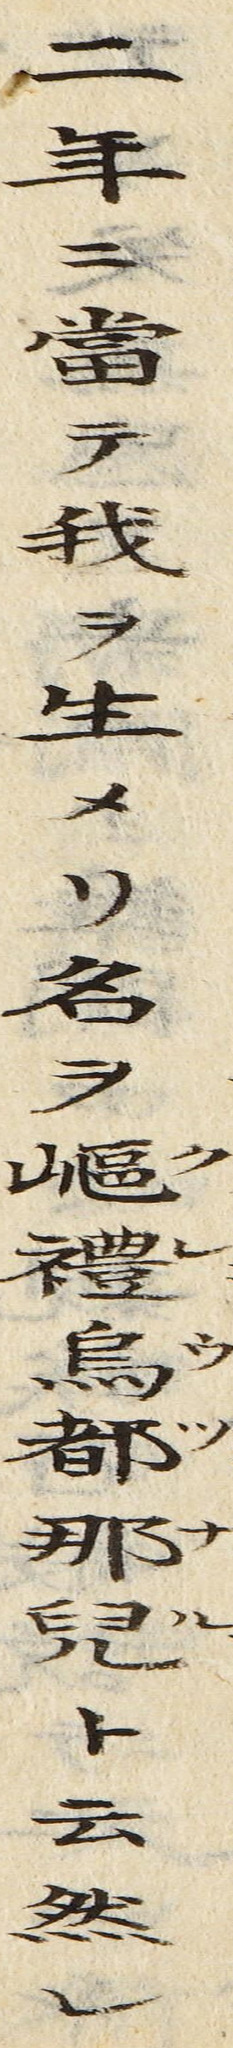二年ニ当テ我ヲ生メリ名ヲ嶇礼烏都那児ト云然レ
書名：漂流紀事
